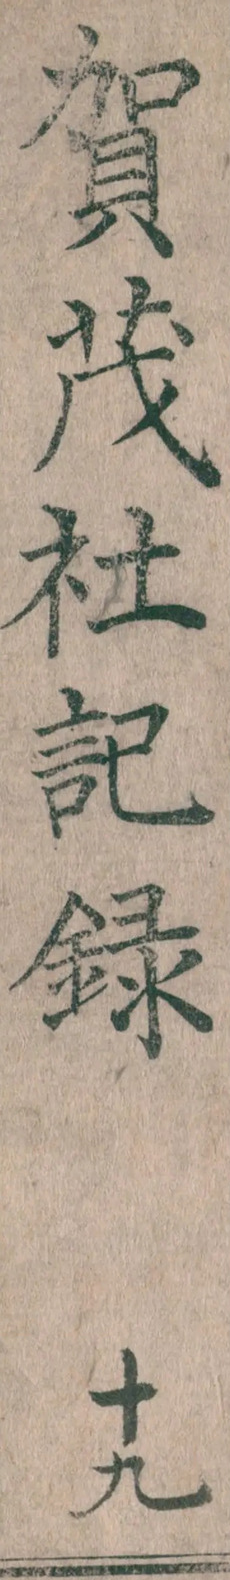賀茂杜記録十九

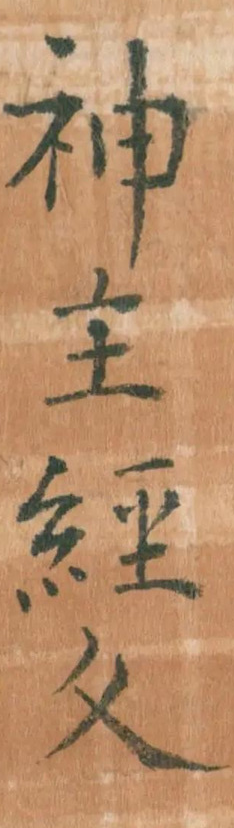神主経久
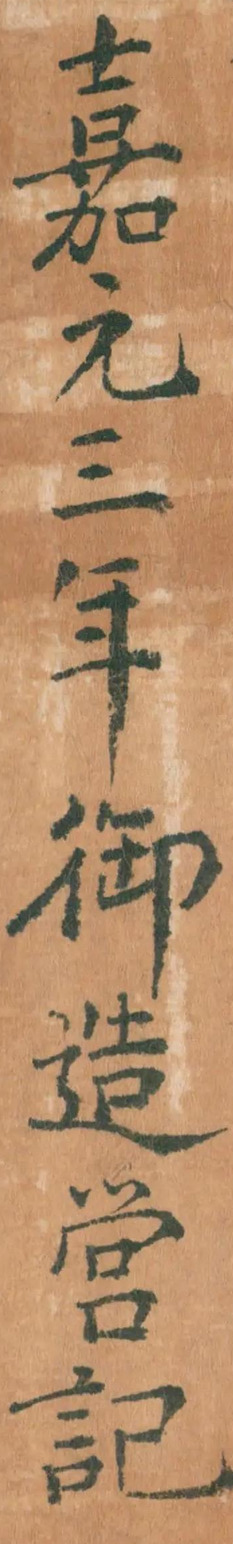嘉元三年御造営記全

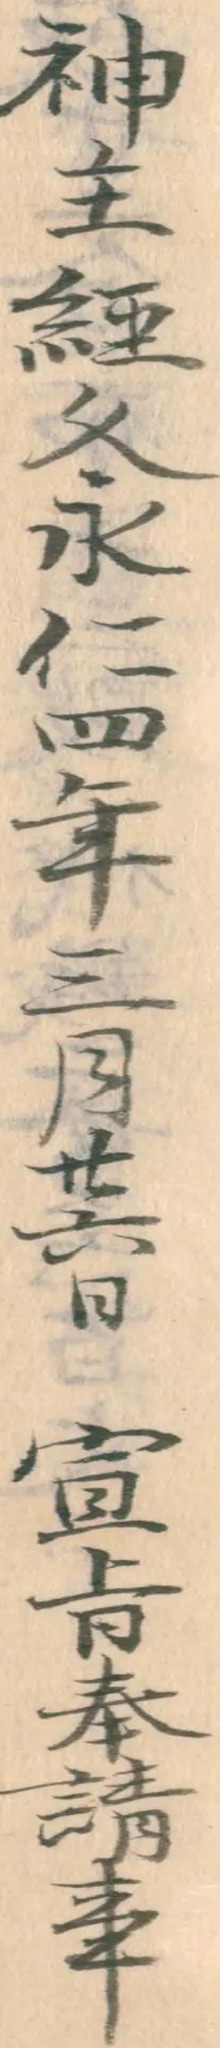神主経久永仁四年三月廿六日宣旨奉請事
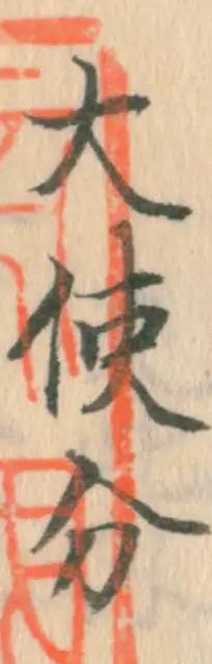大使分
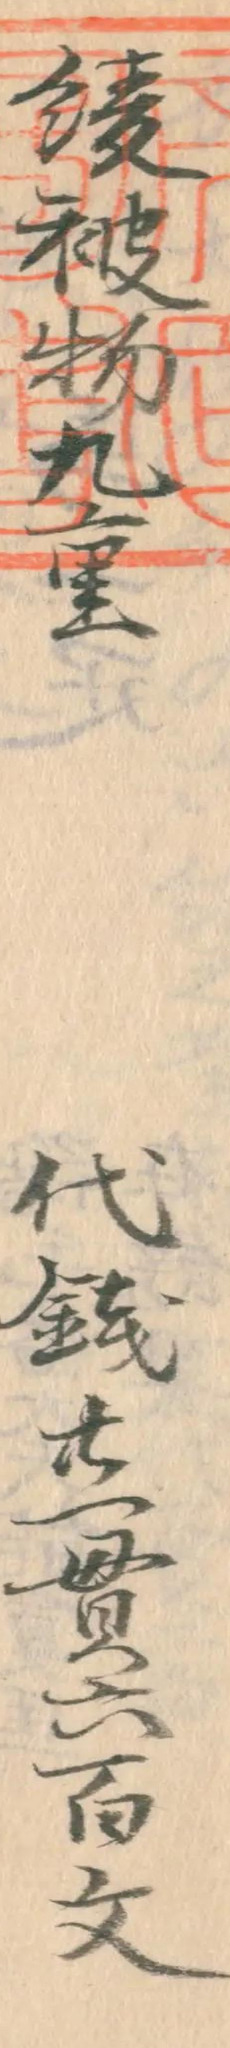綾被物九重代銭廿一貫六百文
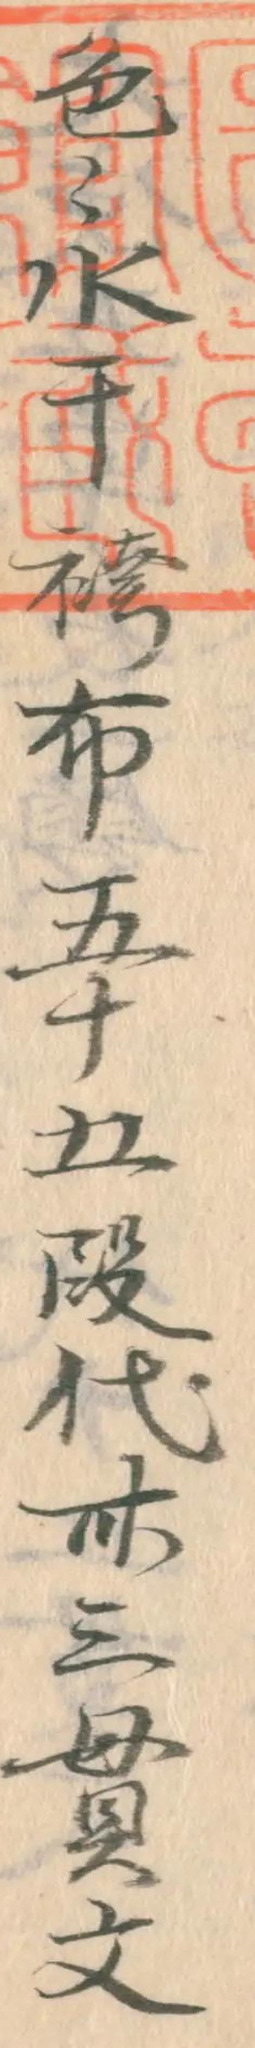色々水干袴布五十五段代卅三貫文
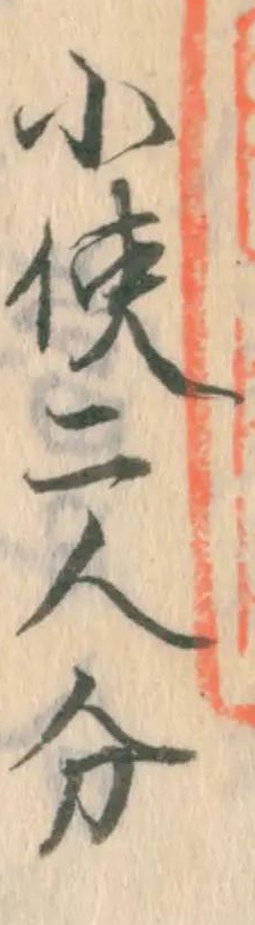小使二人分
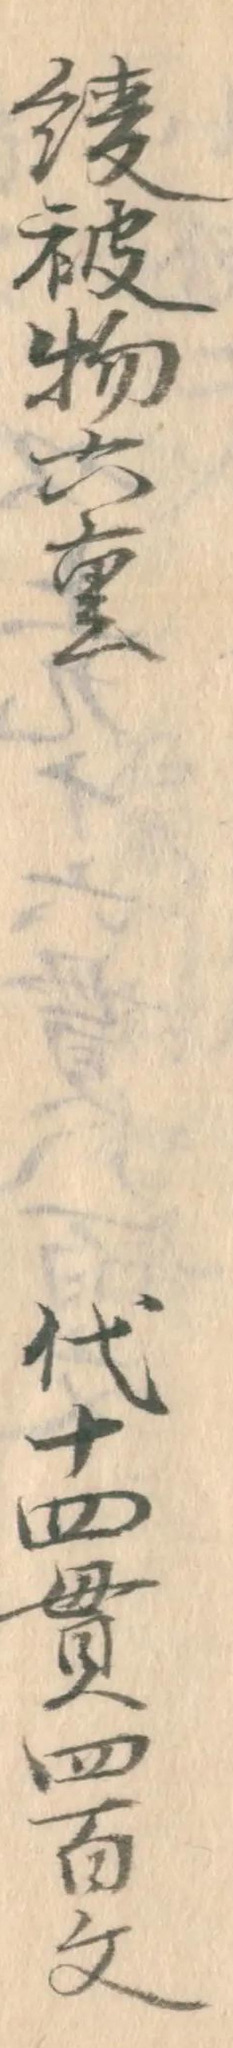綾被物六重代十四貫四百文
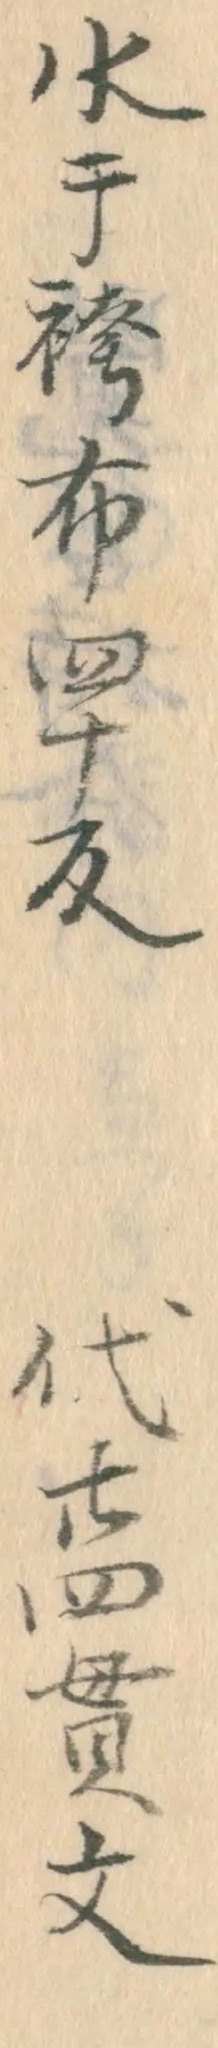水干袴布四十反代廿四貫文

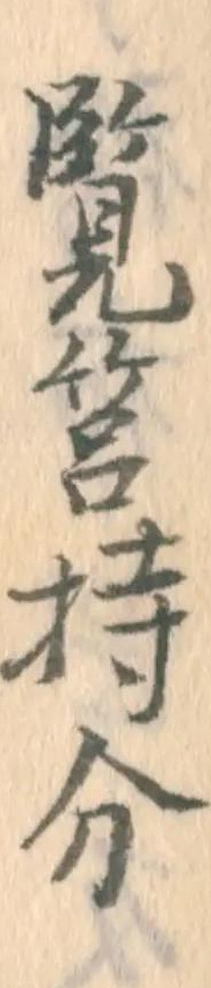覧筥持分
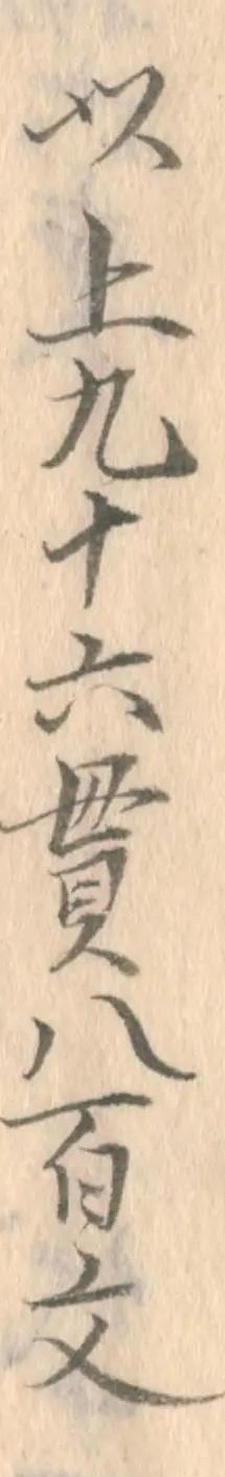以上九十六貫八百文
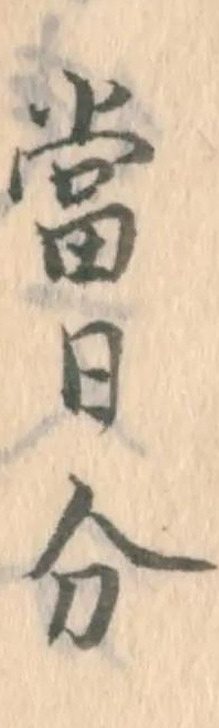当日分
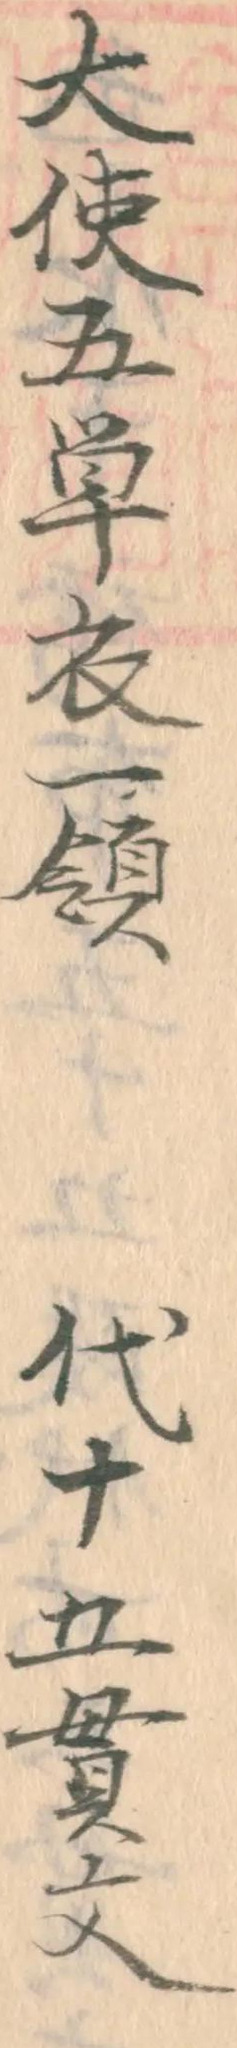大使五単衣一領代十五貫文
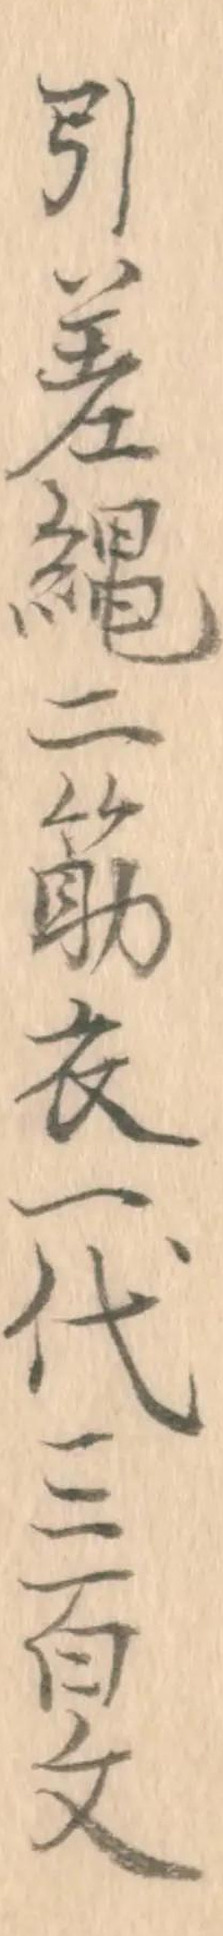引差縄二筋衣一代三百文
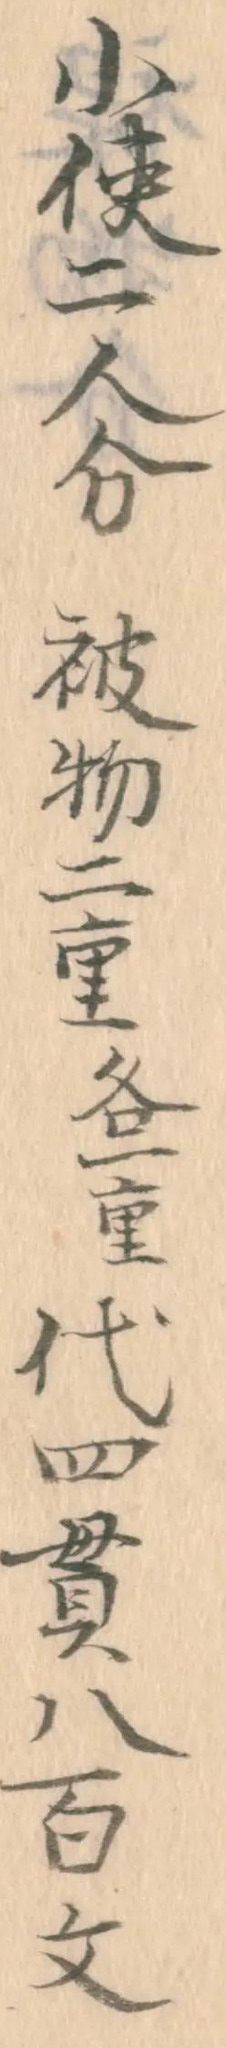小使二人分被物二重各一重代四貫八百文
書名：賀茂社記録. 第19冊
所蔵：国立国会図書館 National Diet Library, JAPAN
